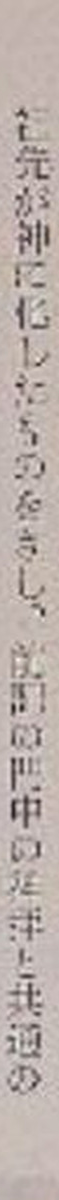祖先が神に化したものをさし、前記の門中の拝と共通の
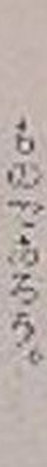ものであろう。
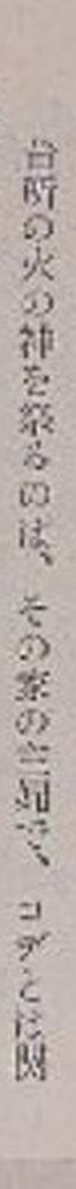台所の火の神を祭るのは、その家の主婦で、コデとは関
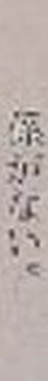係がない。
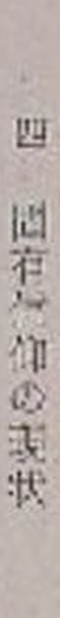四固有信仰の現状
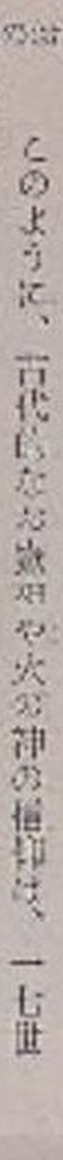このように、古代的なお嶽神や火の神の信仰は、一七世
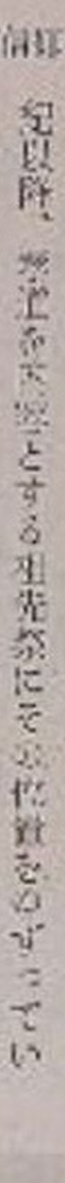紀以降、孝道をとする祖先祭にその位置をゆずってい
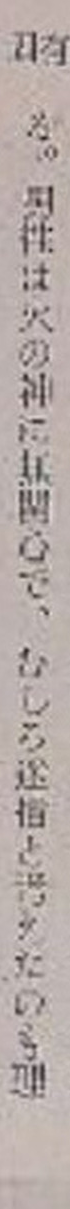る。男性は火の神に無関心で、むしろ迷信と考えたのも理
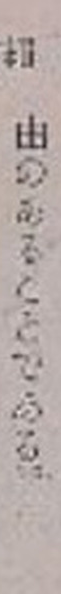由のあることである。

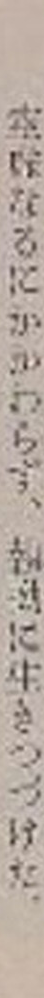空虚なるにかかわらず、執拗に生きつづけた。
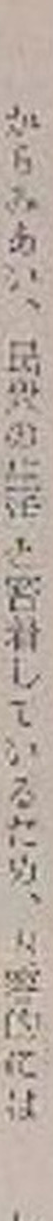からみあい、民衆の生活と密着しているため、内容的には
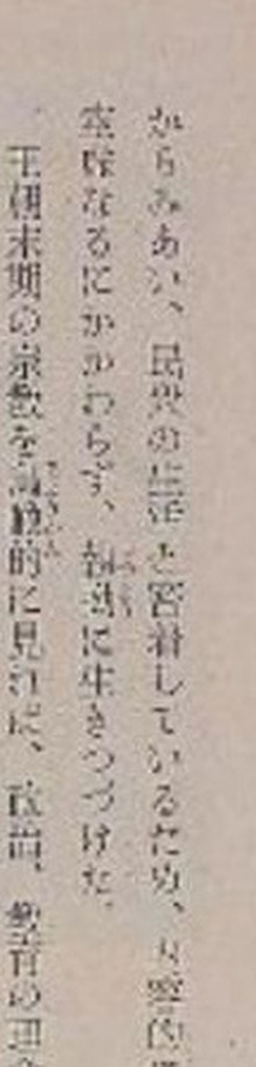空虚なるにかかわらず、執拗に生きつづけた。
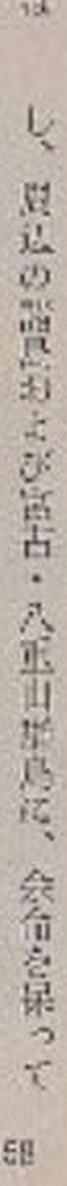し、周辺の諸島および宮古・八重山群島に、余命を保って
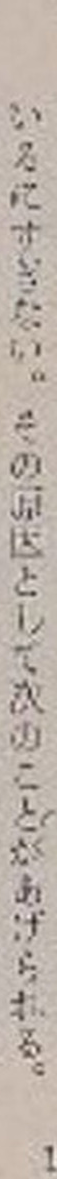いるにすぎない。その原因として次のことがあげられる。
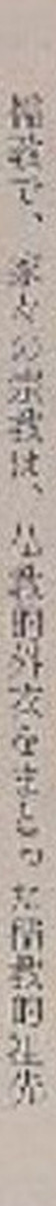儒教で、家々の宗教は、仏教的外衣をまとった儒教的祖先
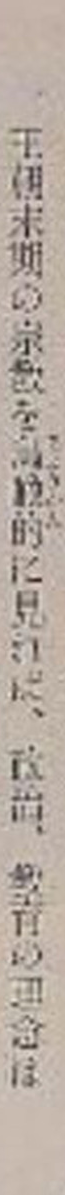王朝末期の宗教を鳥瞰的に見れば、政治、教育の理念は
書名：沖縄固有信仰のおとろえ
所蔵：University of the Ryukyus Library
